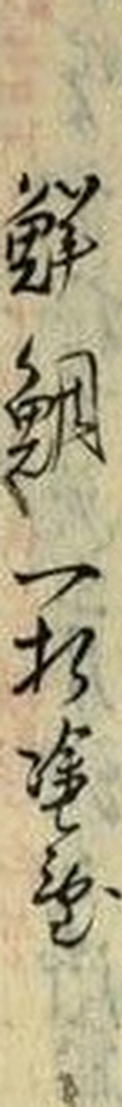鮮鯛一折塗台
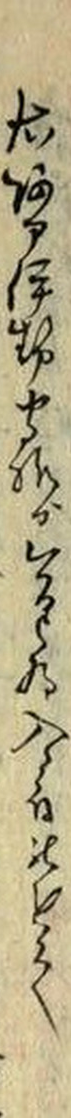右阿部伊勢守様ゟ今日被為入ニ付被進之
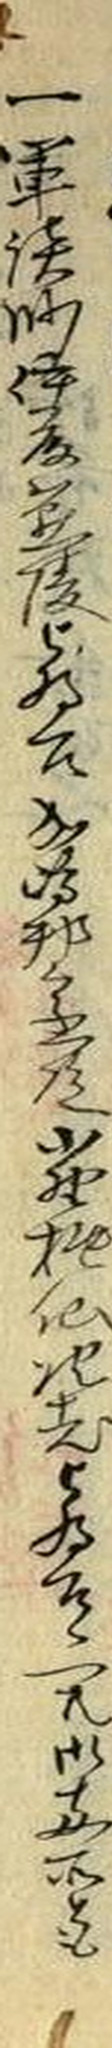一軍談師伊藤燕凌被為召成島邦之丞殿小野桃仙院老被為召候へ共御両所とも
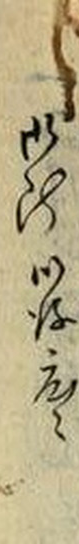御断以後度々
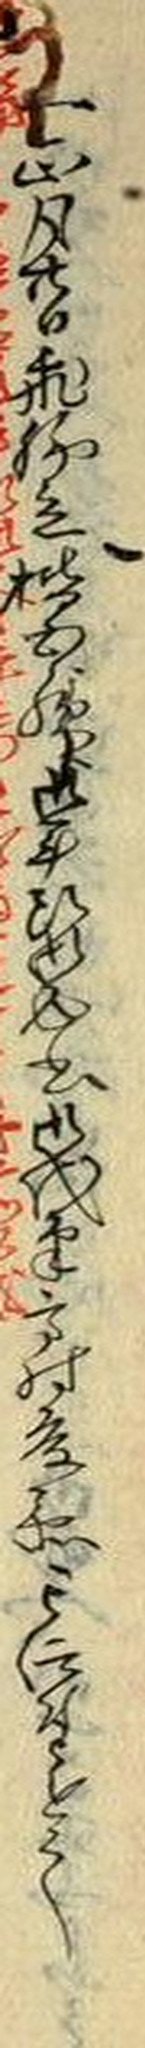一正月廿日飛脚立楷五郎様へ御年頭御内書御代筆高村藤兵衛へ被仰付被進之
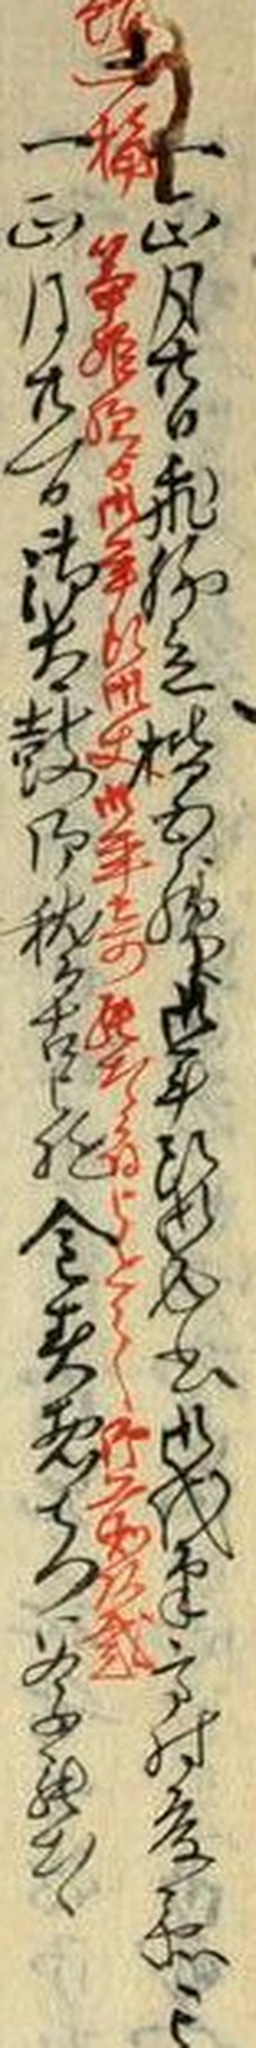一正月廿一日御太鼓御稽古被遊金春惣右衛門父子罷出候
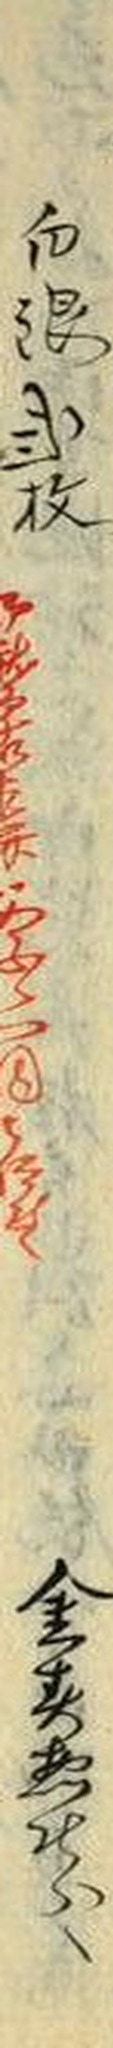白銀弐枚金春惣次郎へ
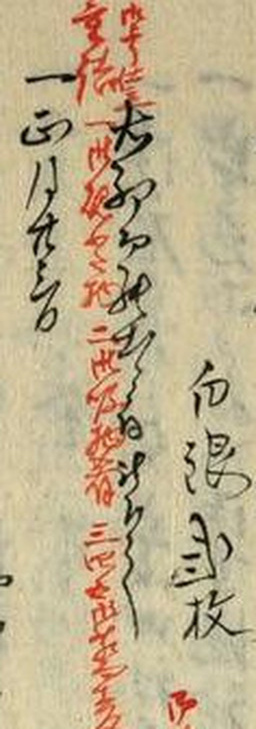右初而罷出候ニ付被下之
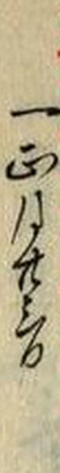一正月廿三日
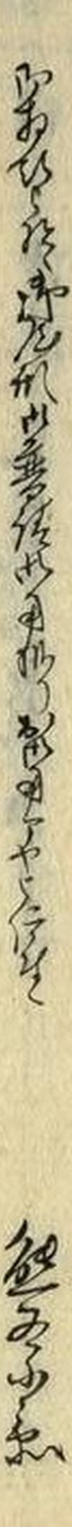御拝領被遊候御屋形御普請御用掛り於御用部や被仰付候熊谷小兵衛
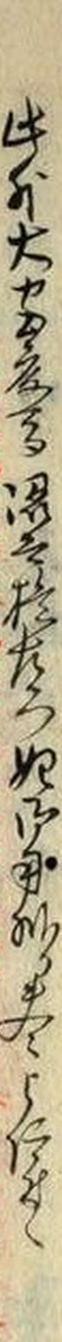此外大宮藤馬渋谷権左衛門始御用掛り夫々被仰付候
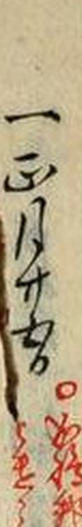一正月廿五日
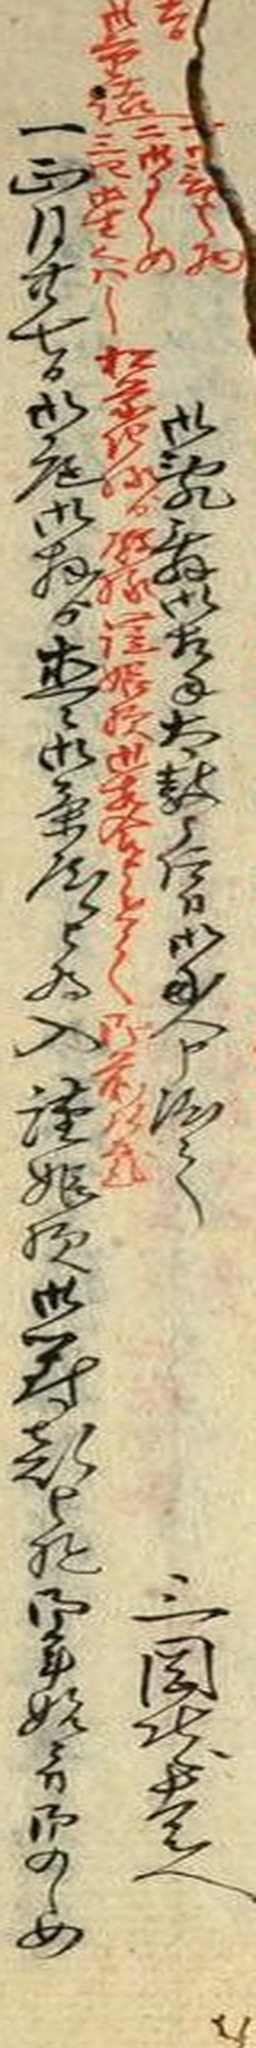一正月廿七日御庭御拝ゟ直々御茶屋被入謹姫様御対顔被遊御年始ニ付御のしめ
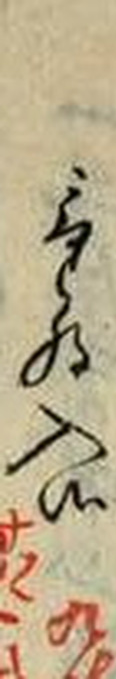ニ而被為入候
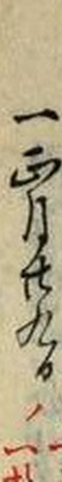一正月廿九日

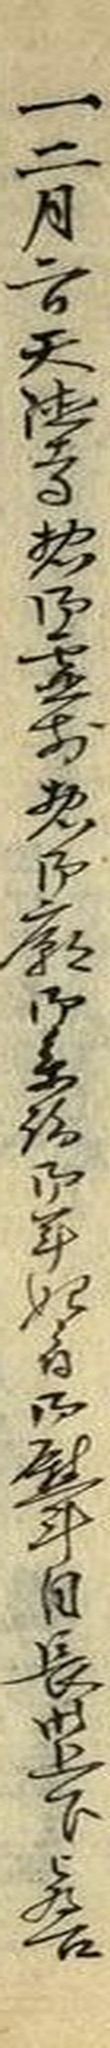一二月二日天徳寺惣御霊前惣御廟御参詣御年始ニ付御熨斗目長御上下被為召
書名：少傅日録抄（斉善付側向頭取日記、江戸并道中、初入在国、逝去後…
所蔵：福井県文書館 Fukui Prefectural Archives
